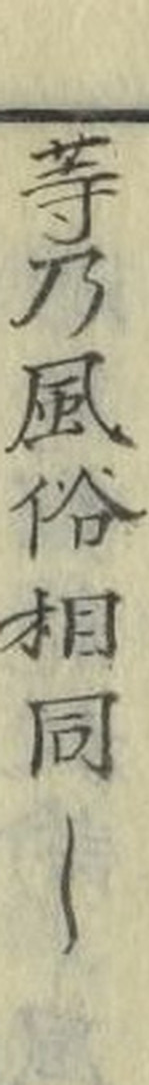等の風俗相同し
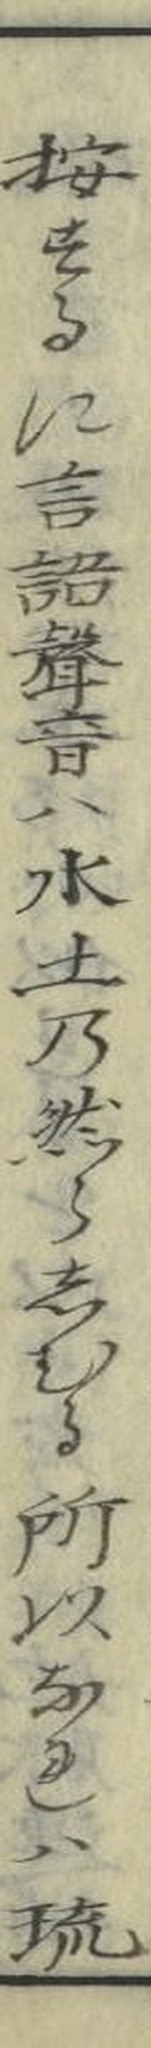按するに言語声音は水土の然らしむる所以なれは琉

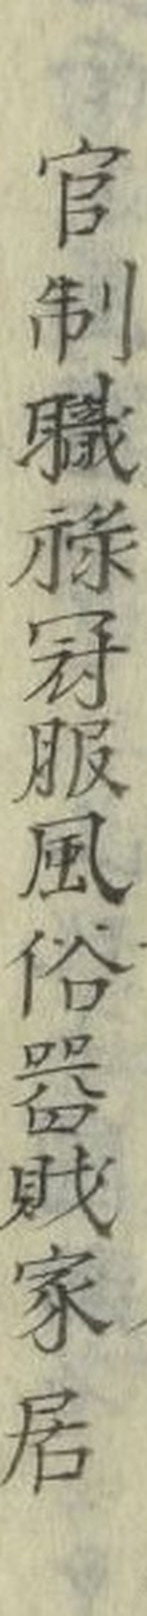官制職禄冠服風俗器財家居
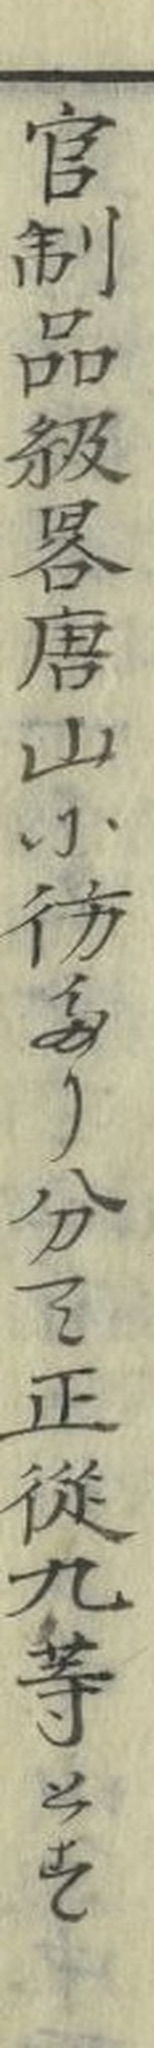官制品級略唐山に彷たり分て正従九等とす
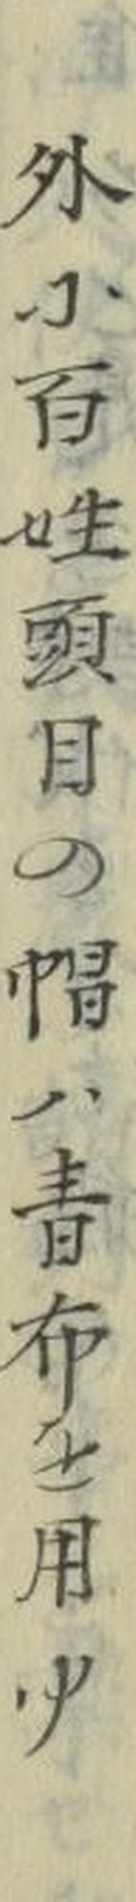外に百姓頭目の帽は青布を用ゆ
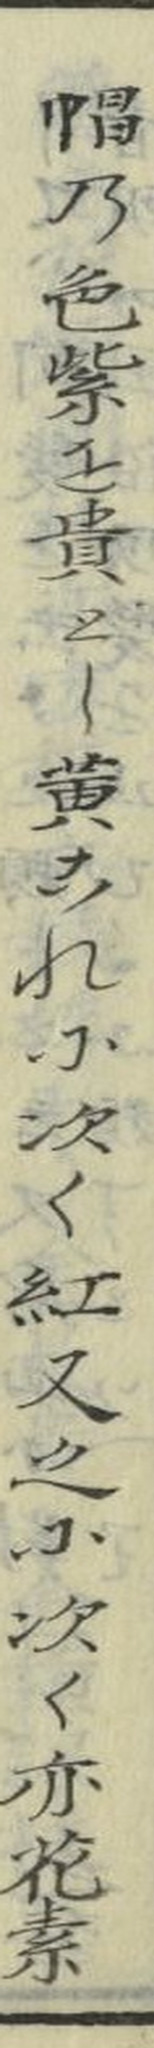帽の色紫を貴とし黄これに次く紅又之に次く亦花素
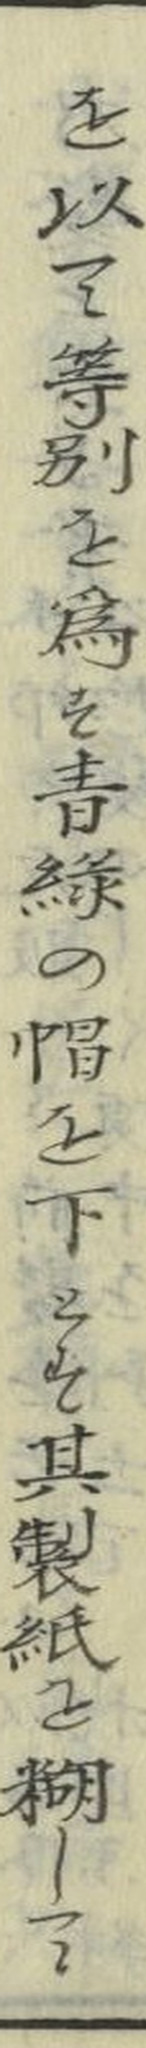を以て等別を為す青緑の帽を下とす其製紙を糊して
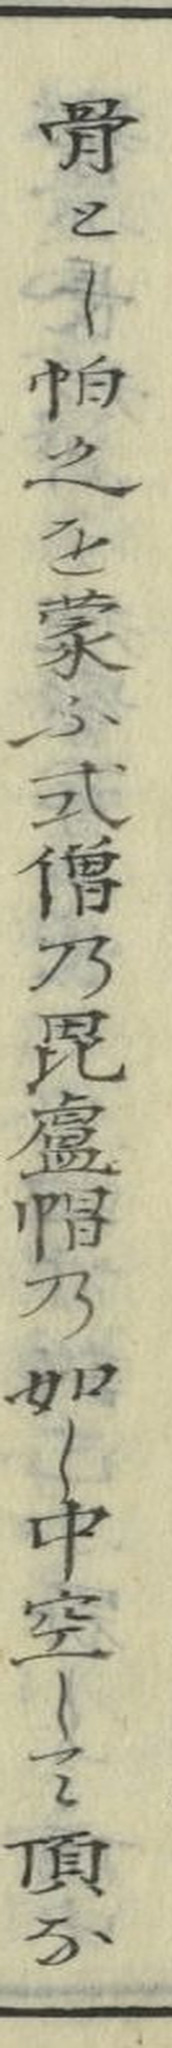骨とし帕之を蒙ふ式僧の毘盧帽の如し中空して頂な
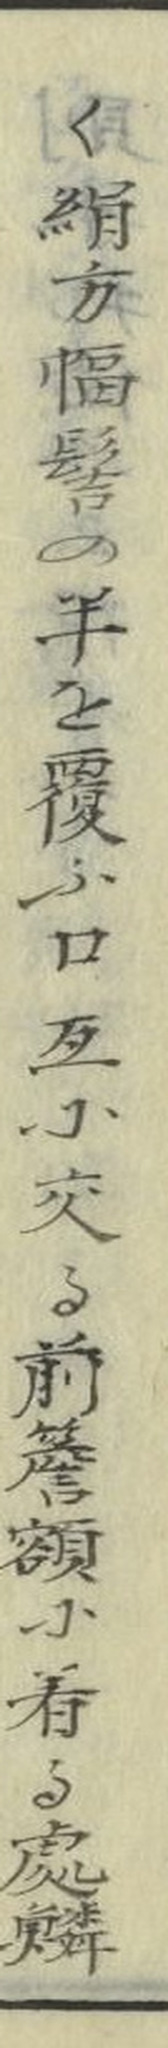く絹方幅髻の半を覆ふ口互に交る前簷額に着る処鱗
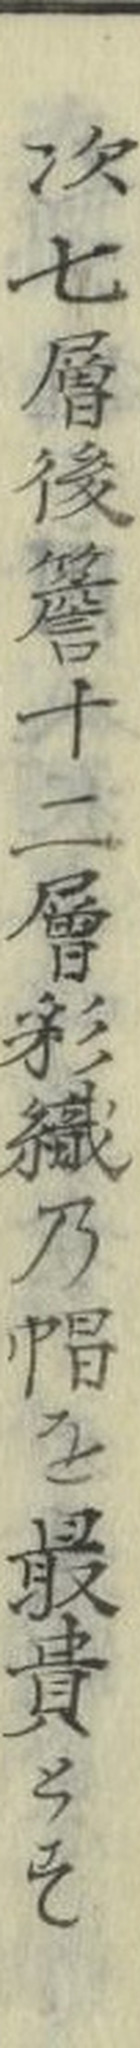次七層後簷十二層彩織の帽を最貴とす
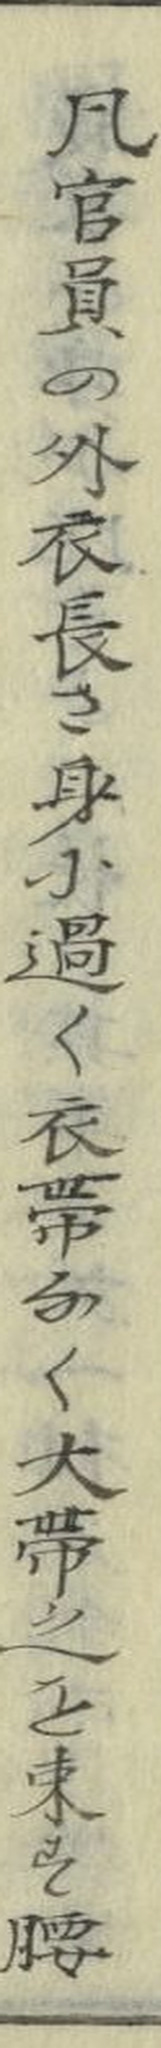凡官員の外衣長さ身に過く衣帯なく大帯之を束す腰
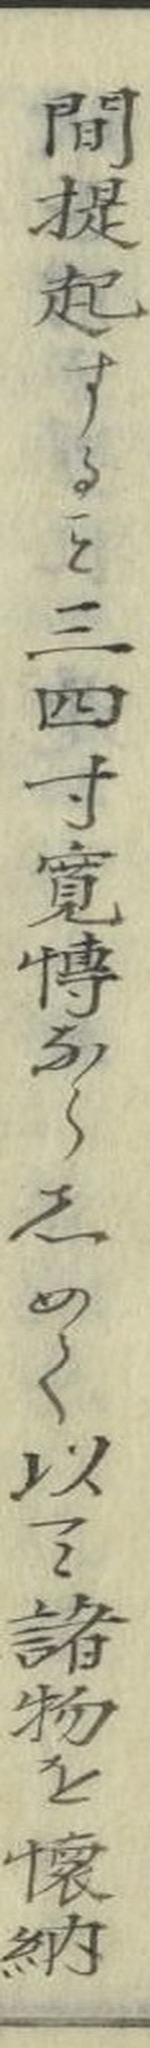間提起すること三四寸寛博ならしめて以て諸物を懐納
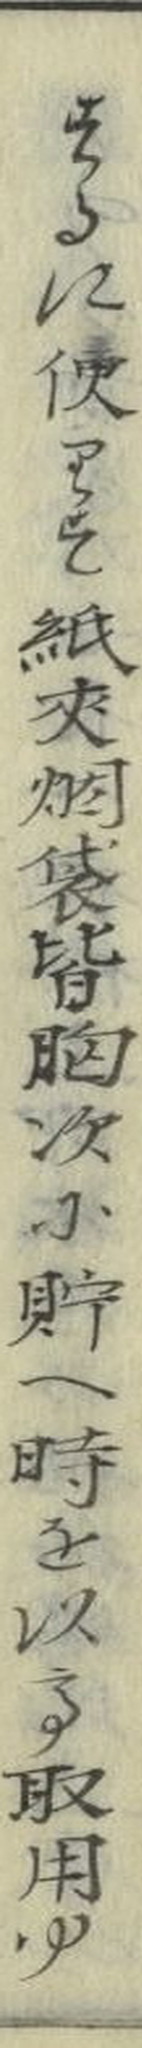するに便りす紙夾烟袋皆胸次に貯へ時を以て取用ゆ
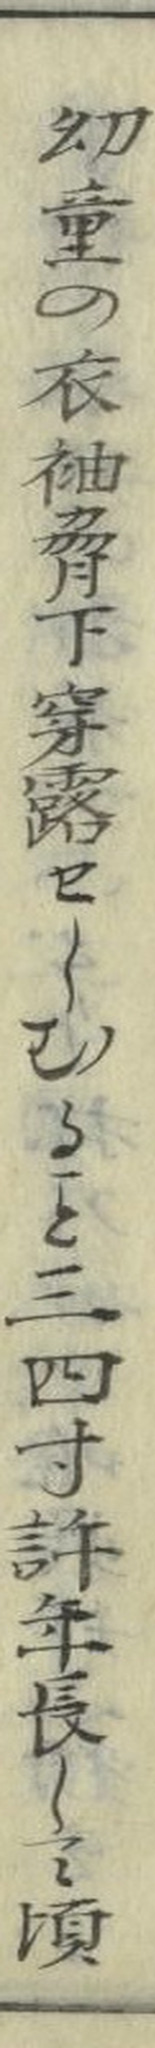幼童の衣袖脇下穿露せしむること三四寸許年長して頂
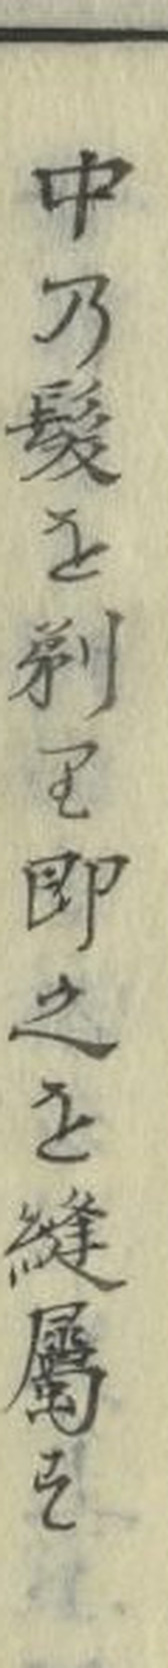中の髪を剃り即之を縫属す

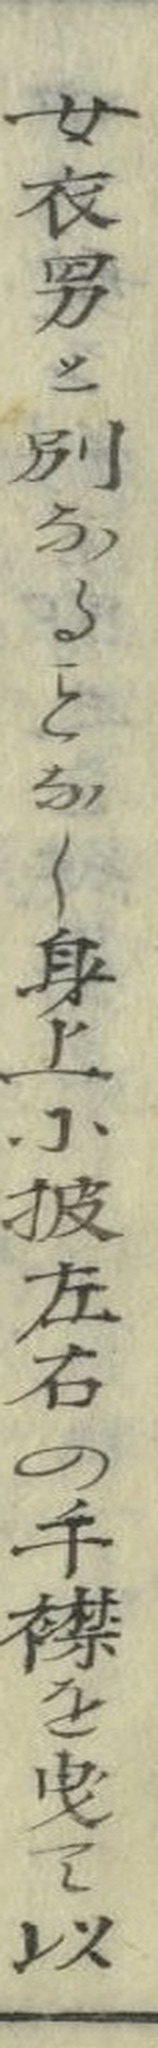女衣男と別なることなし身上に披左右の手襟を曳て以
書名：琉球沿革志 上
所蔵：University of the Ryukyus Library
